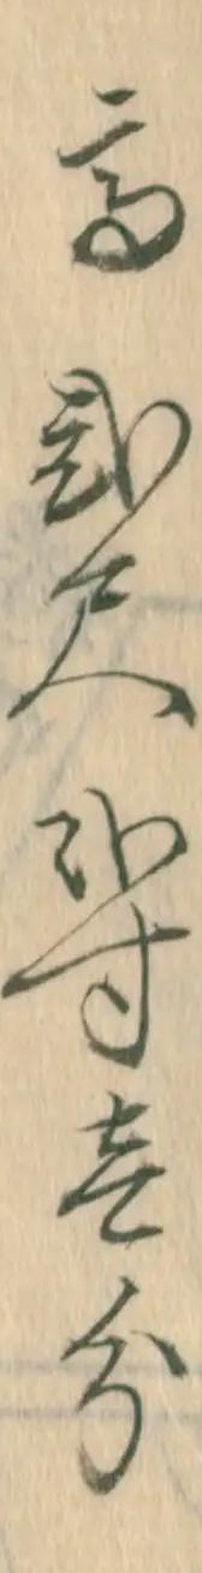長弐尺壱寸壱分
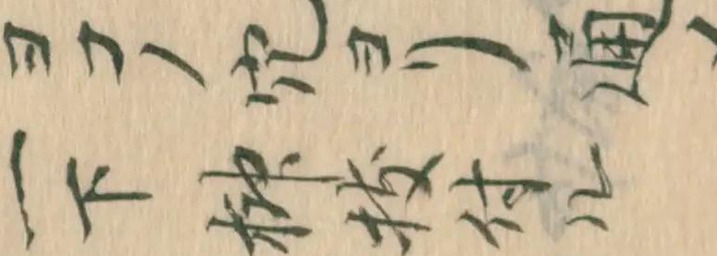一下榊枝付ル
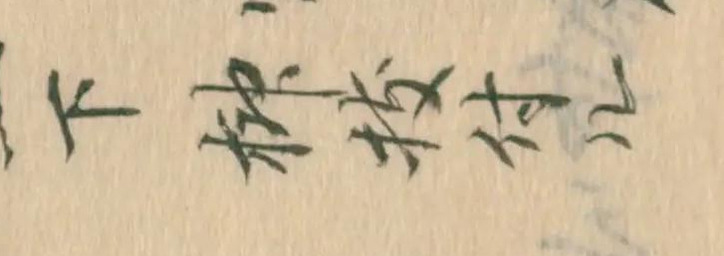一下榊枝付ル
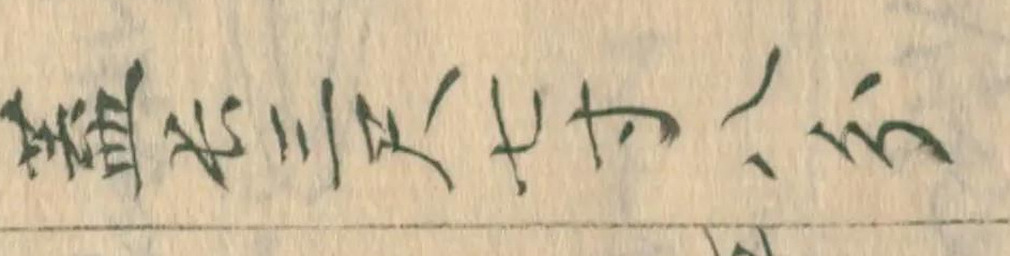蓋長三尺七寸八分
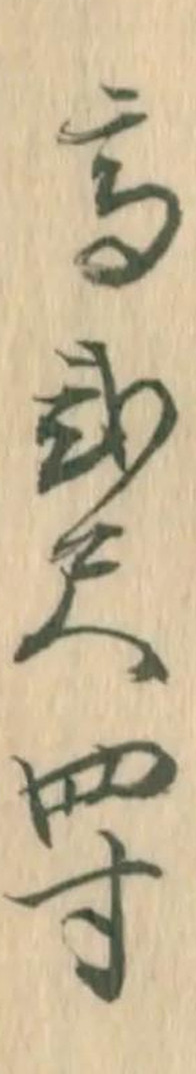高弐尺四寸

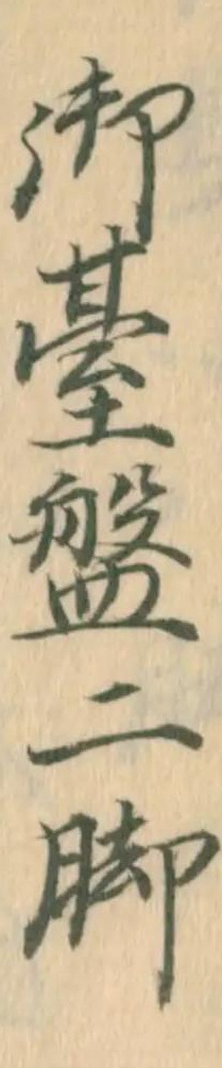御台盤二脚
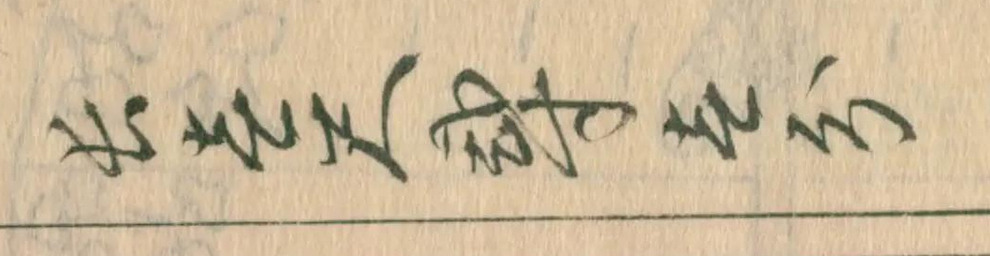横幅壱尺五寸壱分
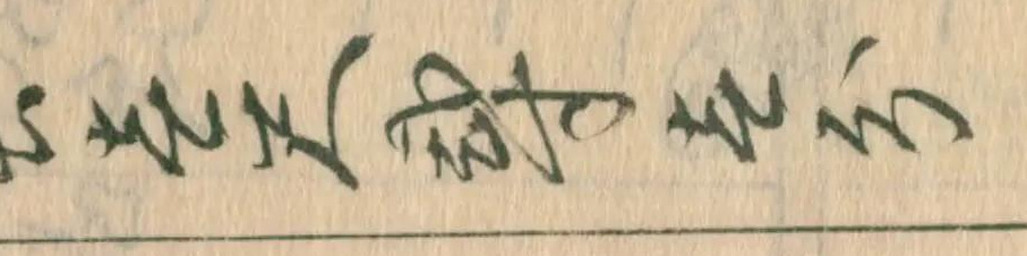横幅壱尺五寸壱分
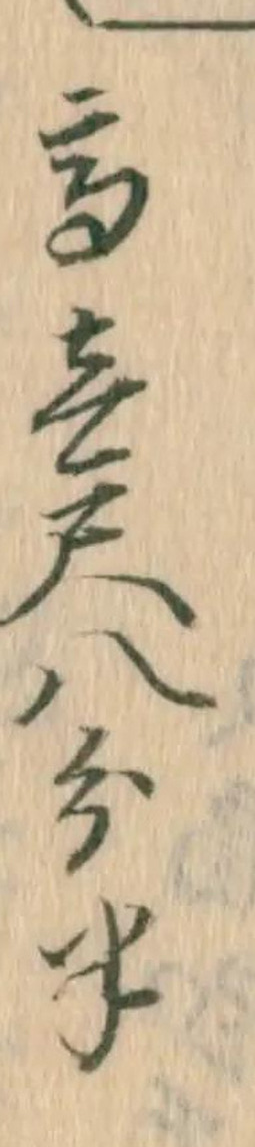高壱尺八分半
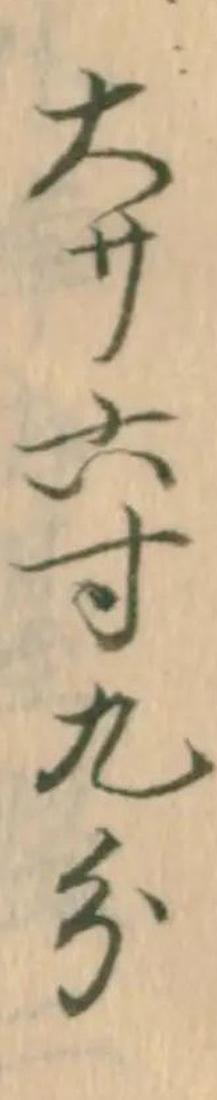楾大サ六寸九分
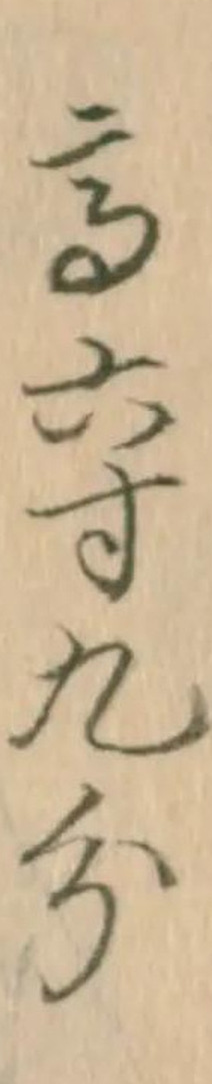高六寸九分
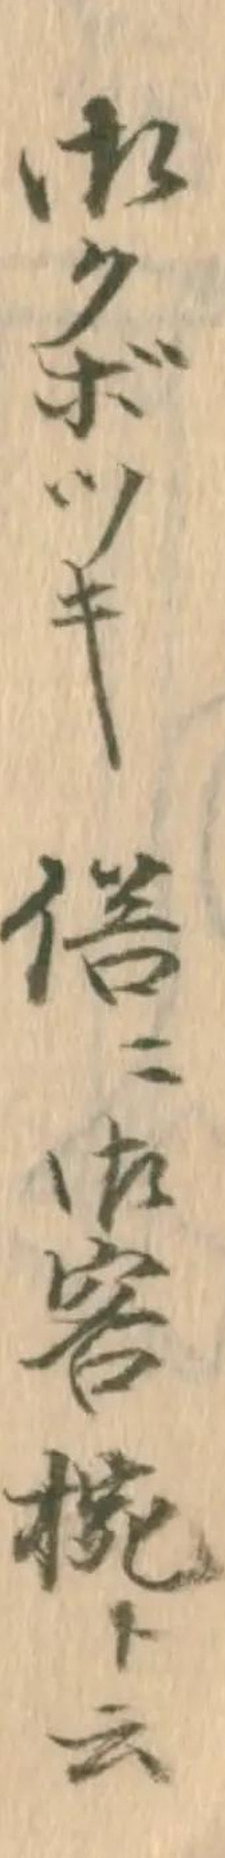御クボツキ俗ニ御客椀ト云
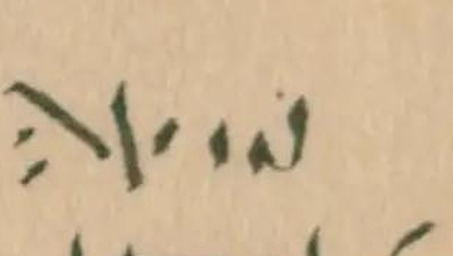ツマミ
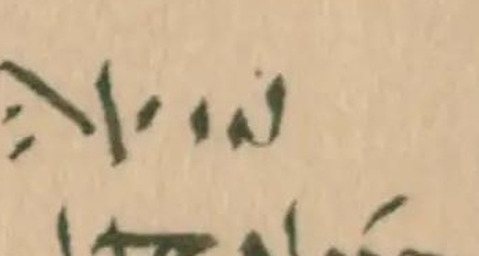ツマミ
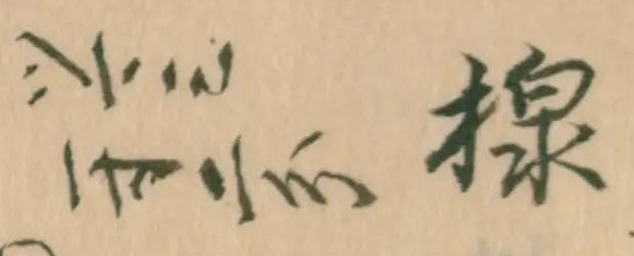一寸二分
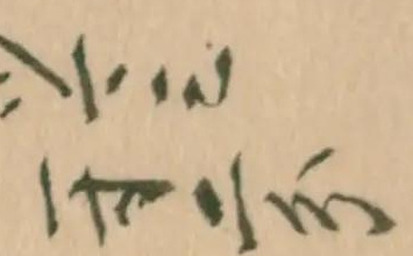ツマミ
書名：賀茂社記録. 第15冊
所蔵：国立国会図書館 National Diet Library, JAPAN
